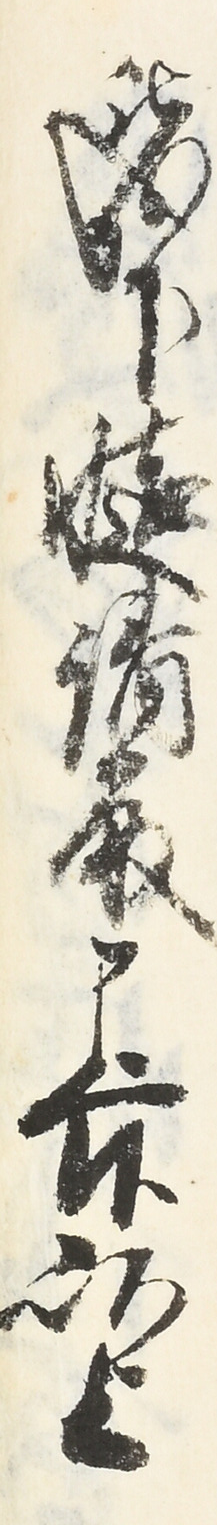被成下慥請取申上候以上
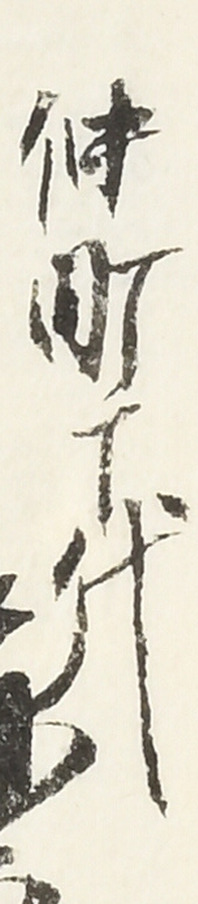仲町丁代
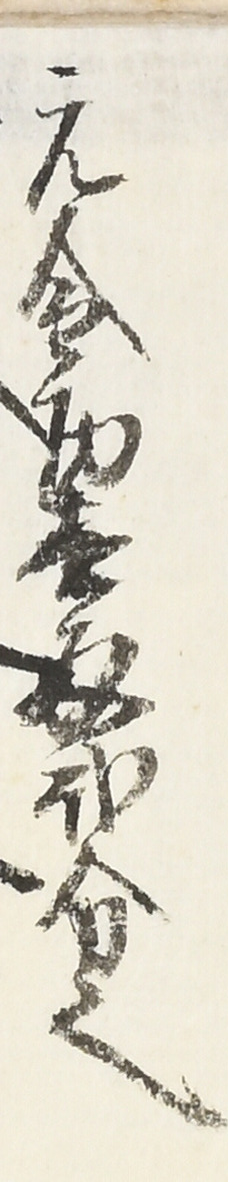元金百壱両弐分也
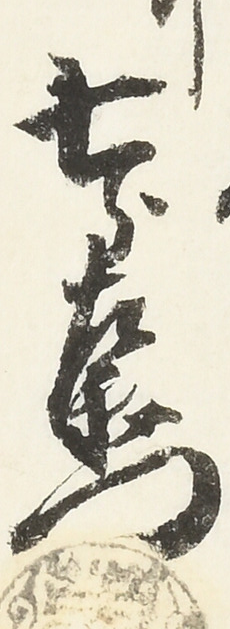七郎左衛門
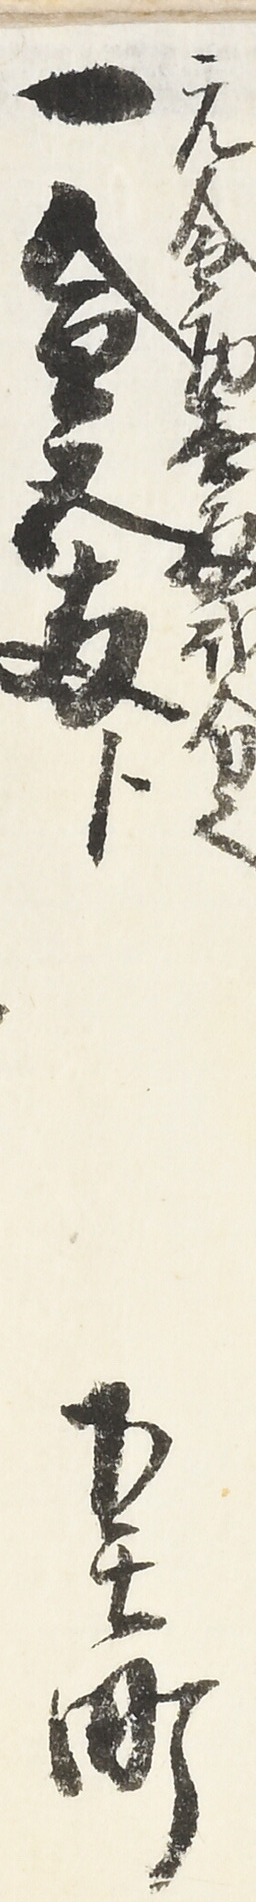一金五両ト下モ町
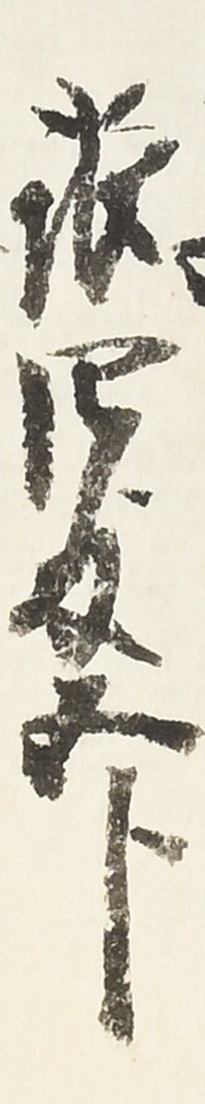銀四匁五分
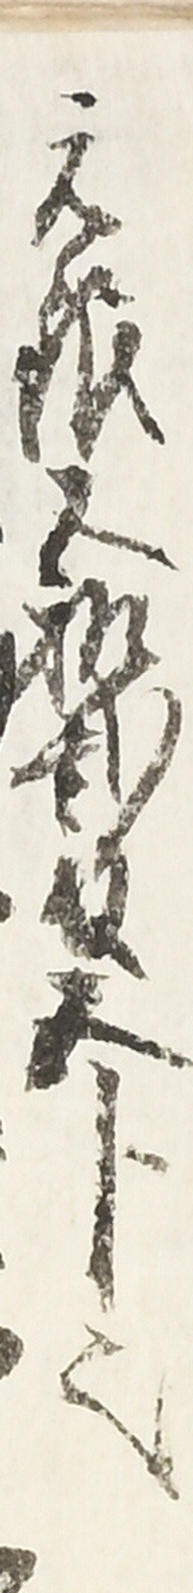元銀五拾弐匁五分也
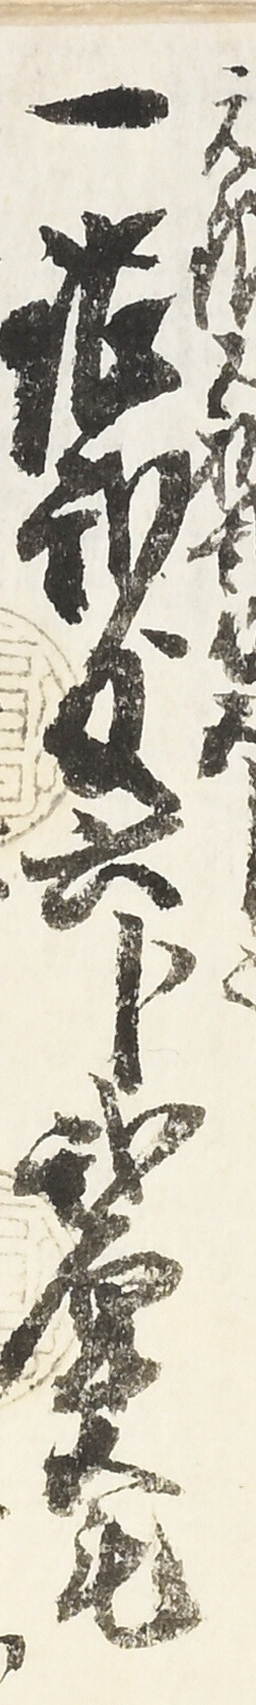一銀弐匁六分弐厘五毛
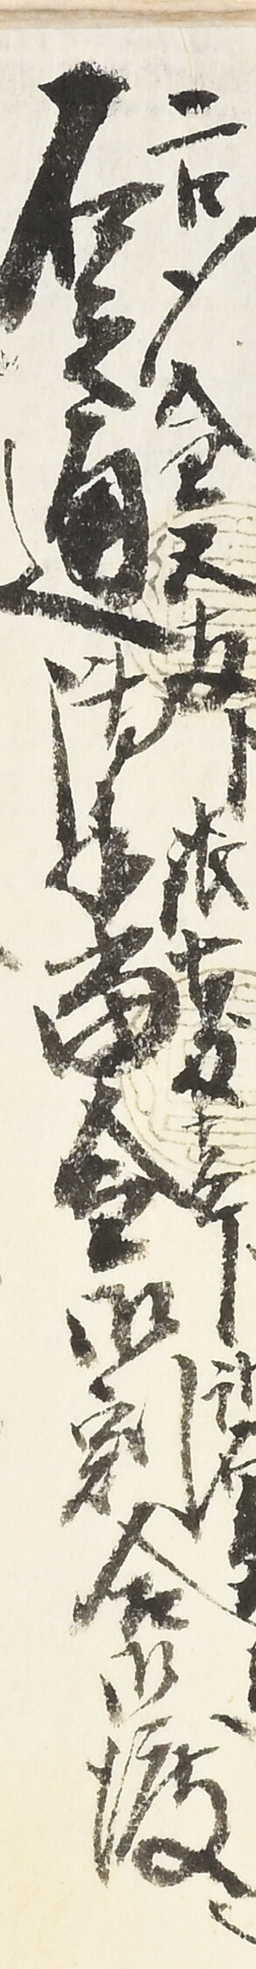右之通御手当金御割合御渡し
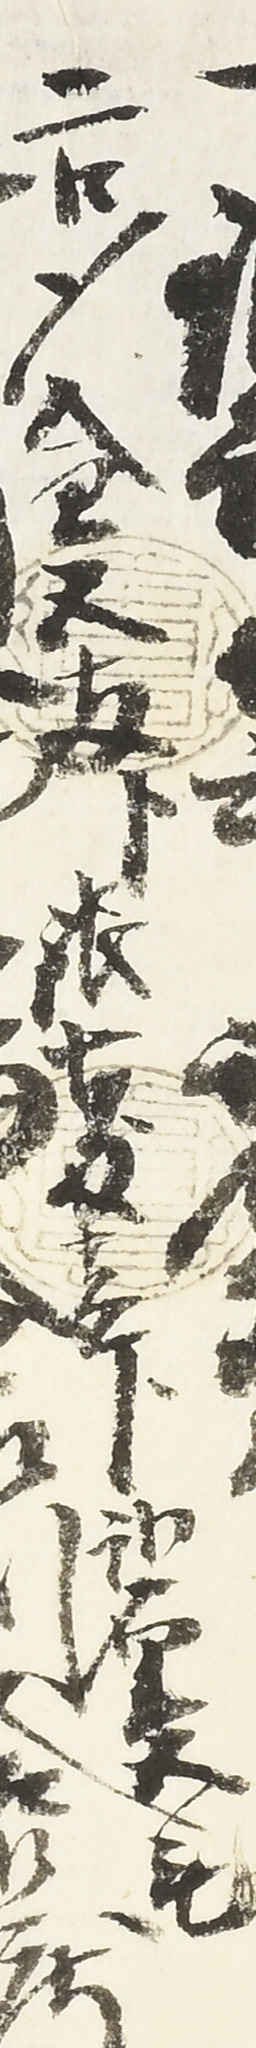二口〆金五両ト銀七匁壱分弐厘五毛
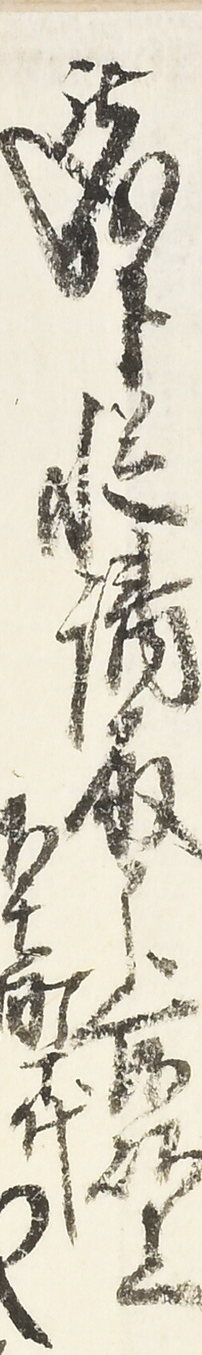被成下慥請取申上候以上
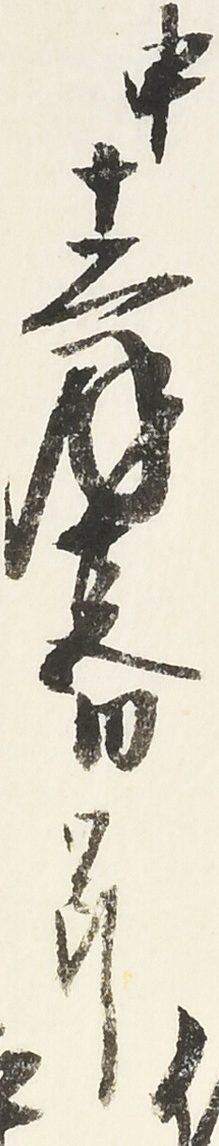十二月廿五日同断
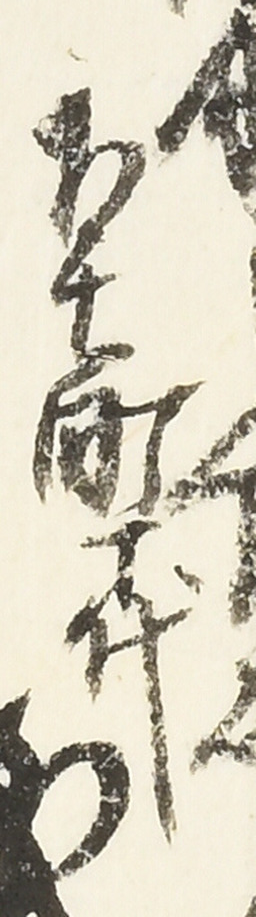下モ町丁代
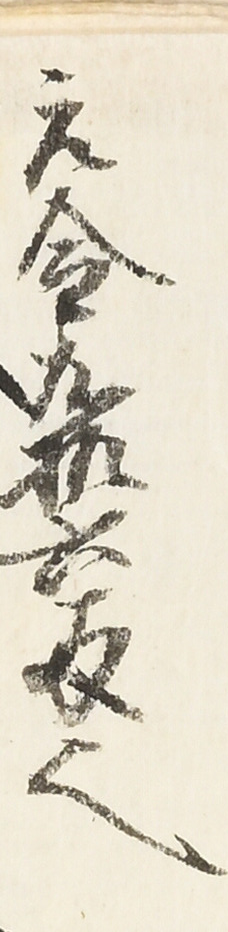元金九拾六両也
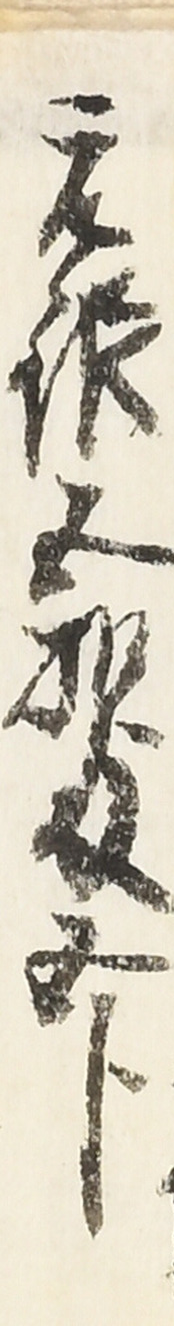元銀五拾匁五分
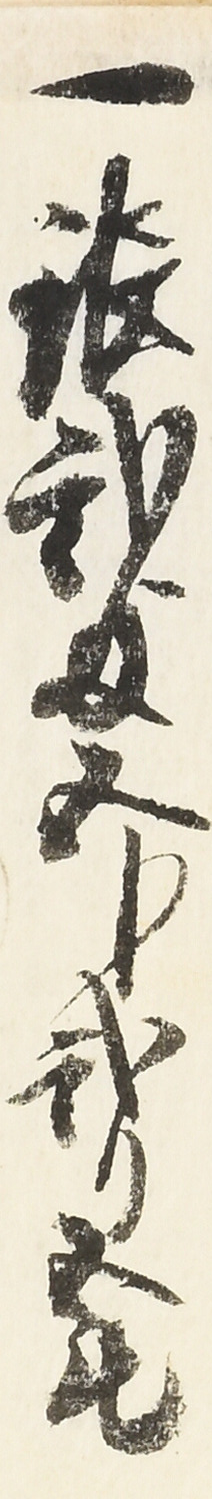一銀弐匁五分弐厘五毛
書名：御才覚金御利足割渡扣帳
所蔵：伊那市立高遠町図書館・合同会社AMANE
